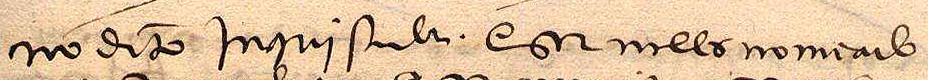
no dito Jnqujsidor e ser nelles nomeado
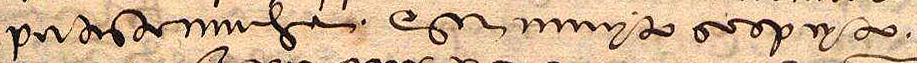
por testemunha e ser muyto sospeyto.
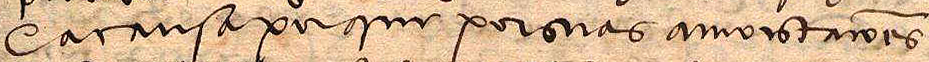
e a causa porque por suas amoestações
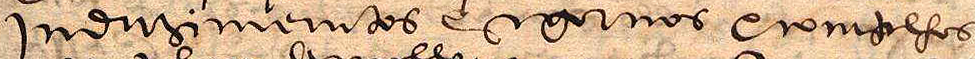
Jnduzimemtos e segornos e comselhos
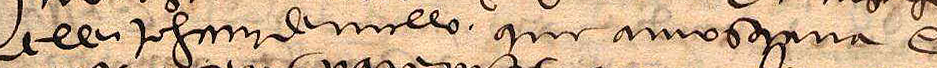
delle Joham de mello. que amostraua e
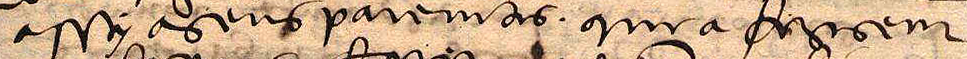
assy a seus paremtes. que a fizesem
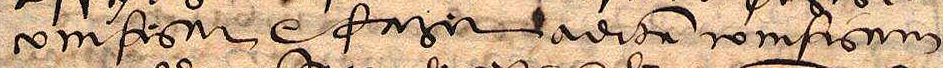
comfesar e fazer a dita comfisam
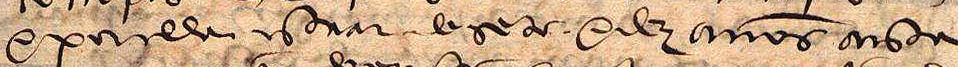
e por ella estaar de sete e dez anōs a esta
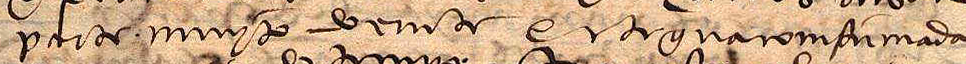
parte muyto doemte e e tegua comfirmada
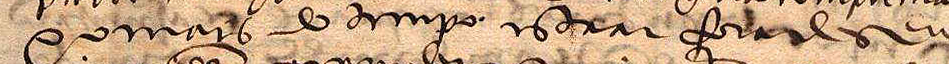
e o mais do tempo estar fora de seu
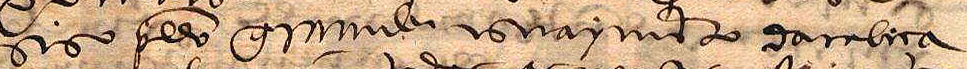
siso p̄llo gramde esuaymēto da cabeça
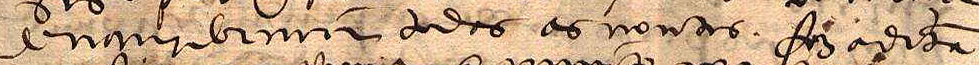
de nam dormir todas as noutes. fez a dita
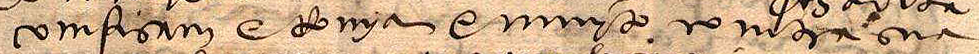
comfisam eRonya e muyto comtra sua
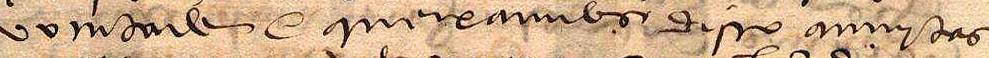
vomtade e queixamdose disso a muytas
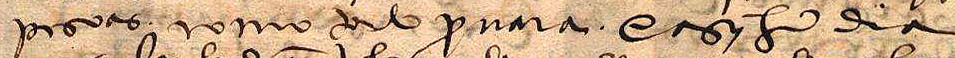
pesoas. como todo ꝓuara e asy hū dia
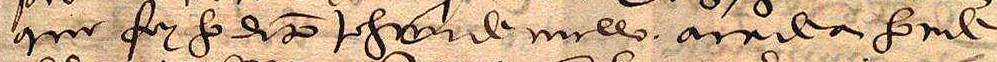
que foy ho dito Joham de mello. a cadea honde
